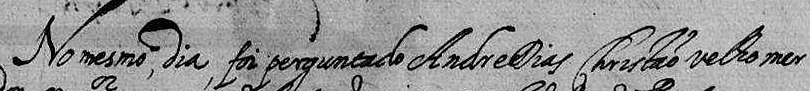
No mesmo, dia, foi perguntado Andre Dias Christaõ velho mer
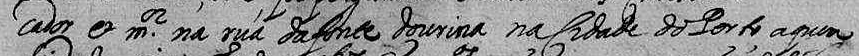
cador & m.or na rua da fonte dourina na Cidade do Porto a quem
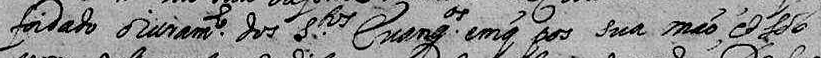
foi dado o iuramto. dos s.tos Euang.os em q̄ pos sua maõ, & sob
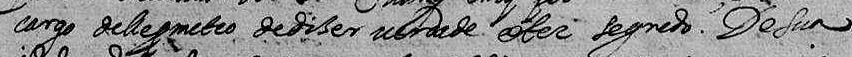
cargo delle ꝓmeteo de dizer uerdade & ter segredo. De sua
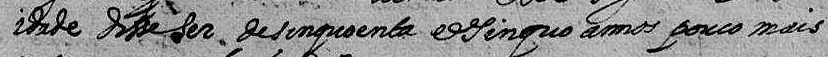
idade disse ser de sinquoenta & sinquo annos pouco mais
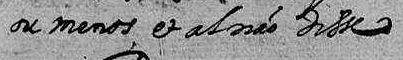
ou menos & al naõ disse
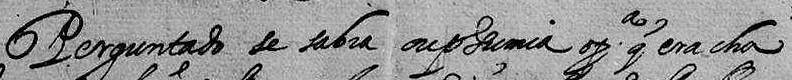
Perguntado se sabia ou p̄sumia o ꝑ.ao q̄ era cha
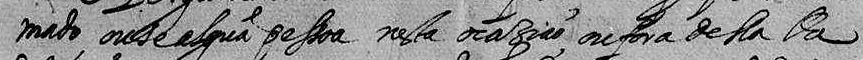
mado, ou se alguā pessoa nesta ocaziaõ ou fora della lhe
